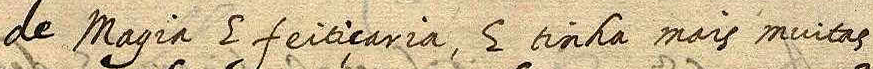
de Magia e feitiçaria, e tinha mais muitas
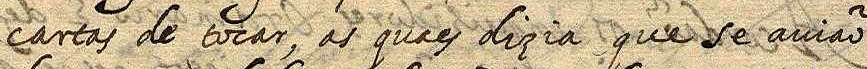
cartas de tocar, as quaes dizia que se auiaõ
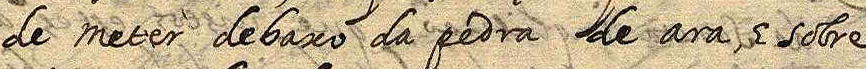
de meter debaxo da pedra de ara, e sobre
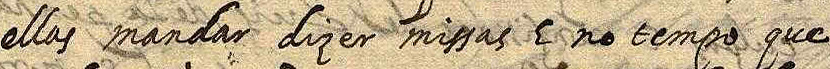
ellas mandar dizer missas e no tempo que
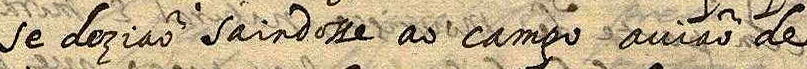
se deziaõ saindosse ao campo auiaõ de
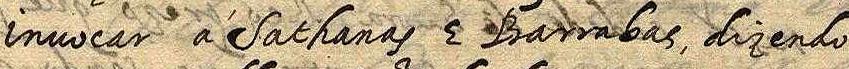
inuocar a Sathanas e Barrabas, dizendo
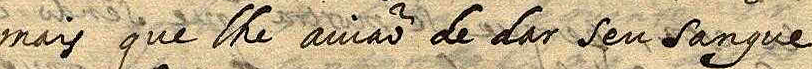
mais que lhe auiaõ de dar seu sangue
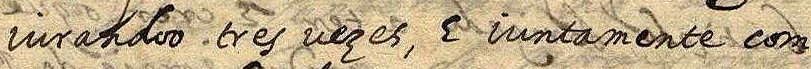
iurando o tres uezes, e iuntamente com
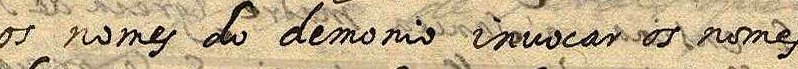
os nomes do demonio inuocar os nomes
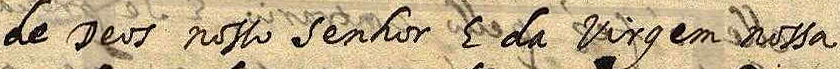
de Deos nosso Senhor e da Virgem nossa
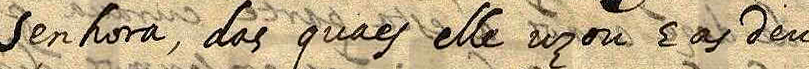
Senhora, das quaes elle uzou e as deu
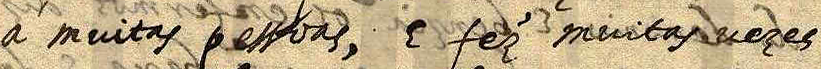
à muitas pessoas, e fez̄ muitas uezes
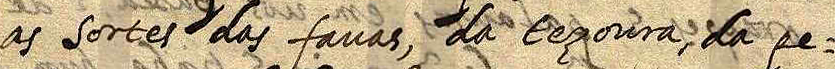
as sortes das fauas, da tezoura, da pe
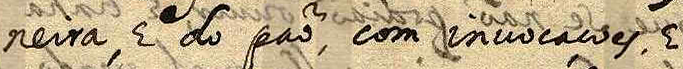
neira, e do paõ, com inuocaçoes, e
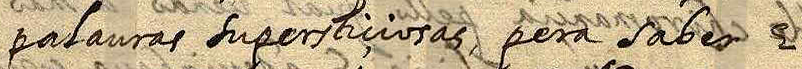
palauras superstiçiosas, pera saber e
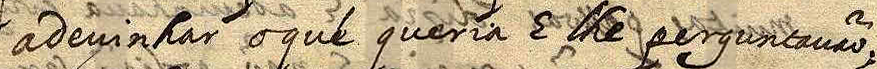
adeuinhar o que queria e lhe perguntauaõ,
